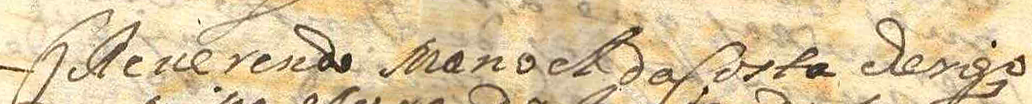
O Reuerendo Manoel da Costa clerigo
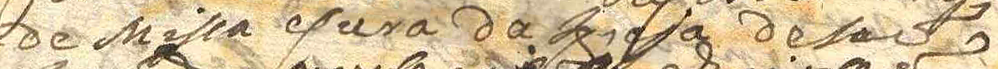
de Missa e Cura da Igreja de saõ
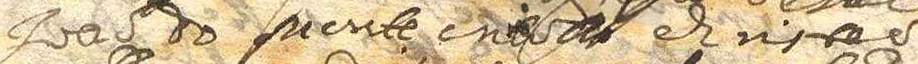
Joaõ do Monte, e nella christaõ
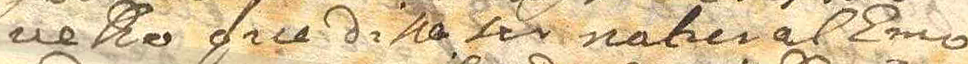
uelho que disse ser natural E mo
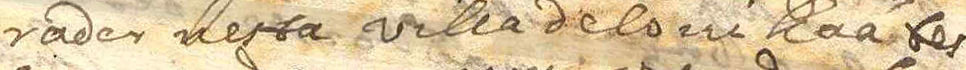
rador nesta villa de Couilhaã tes
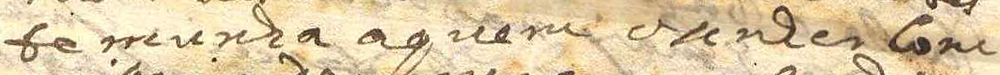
temunha a quem o senhor com
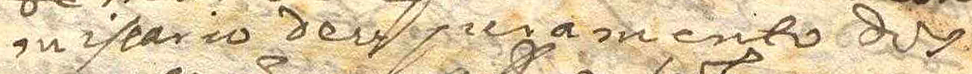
missario deu juramento dos
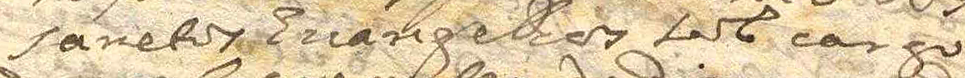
sanctos Euangelhos sob cargo
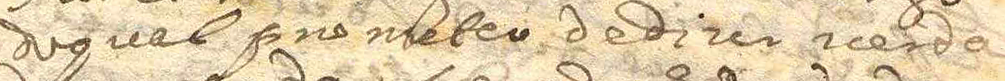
do qual prometeo de dizer uerda
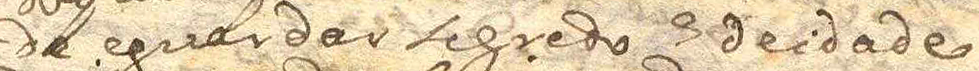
de e guardar segredo E de idade
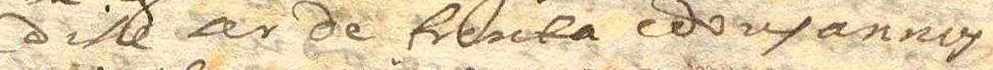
disse ser de trinta e dous annos
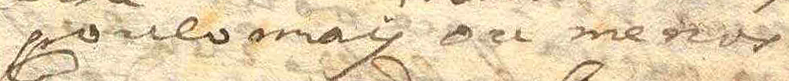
pouco mais ou menos
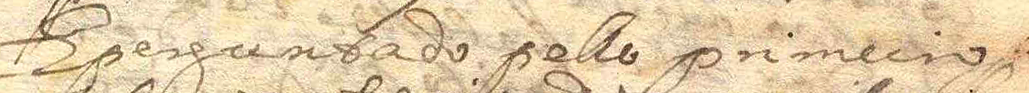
E perguntado pello primeiro
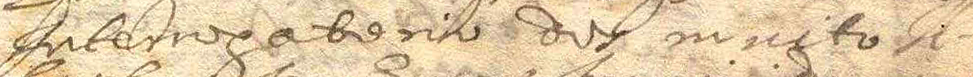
Jnterrogatorio dos muito Il
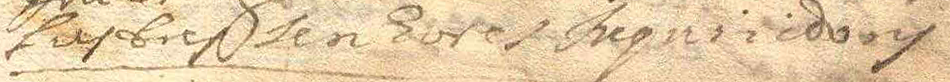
lustres senhores Inquizidores
